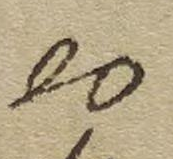so
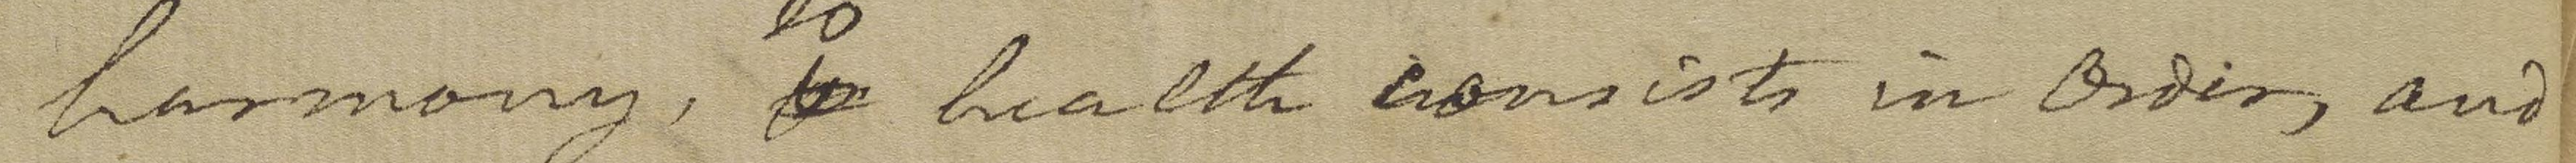harmony, [&] health consists in order, and
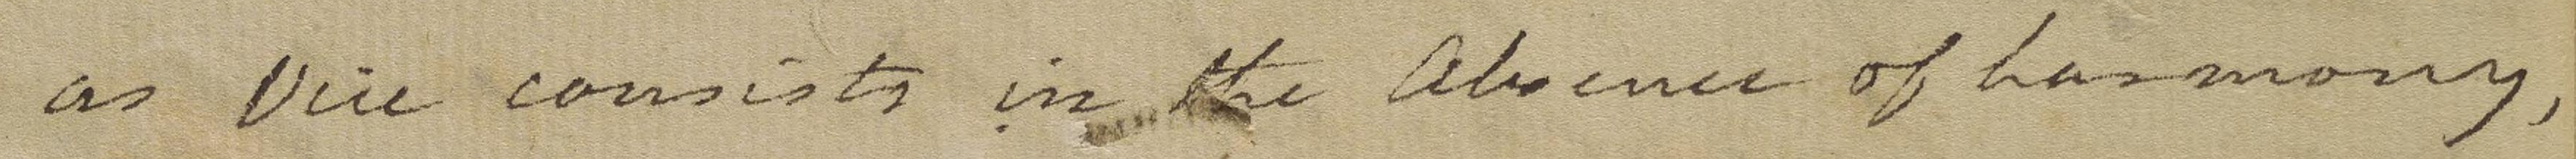as Vice consists in the absence of harmony,
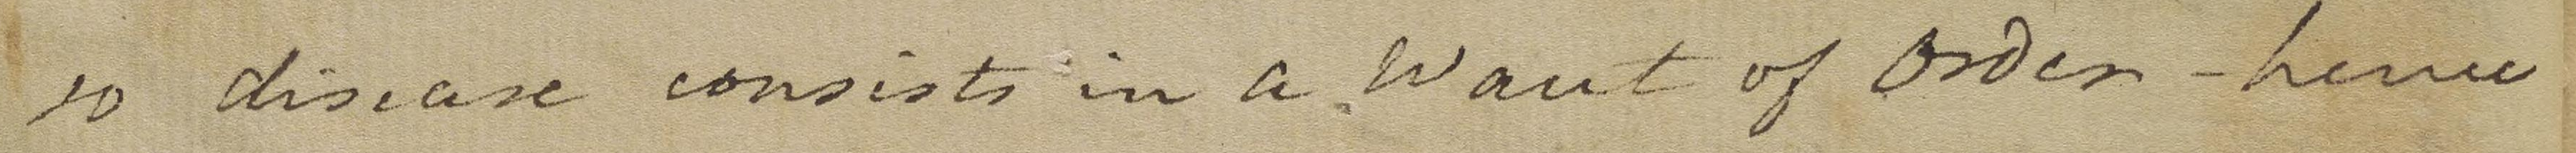so disease consists in a want of order- hence
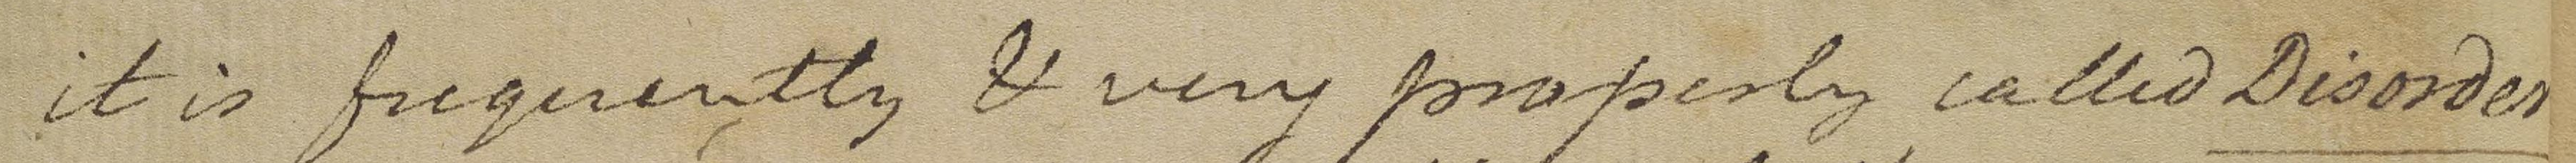it is frequently & very properly called Disorder
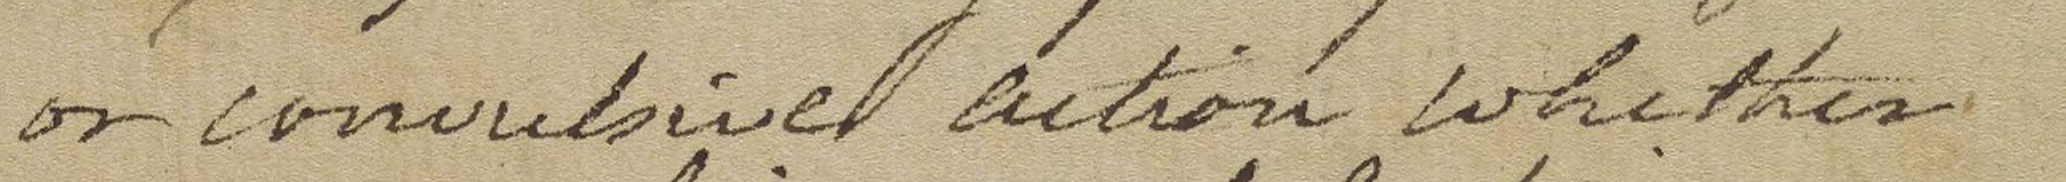or convulsive action whether
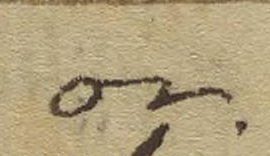or
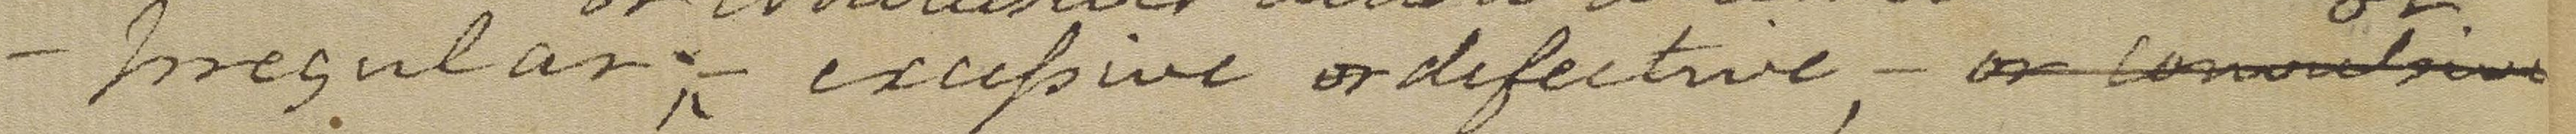- irregular ^ - excessive or defective, - [or convulsive]
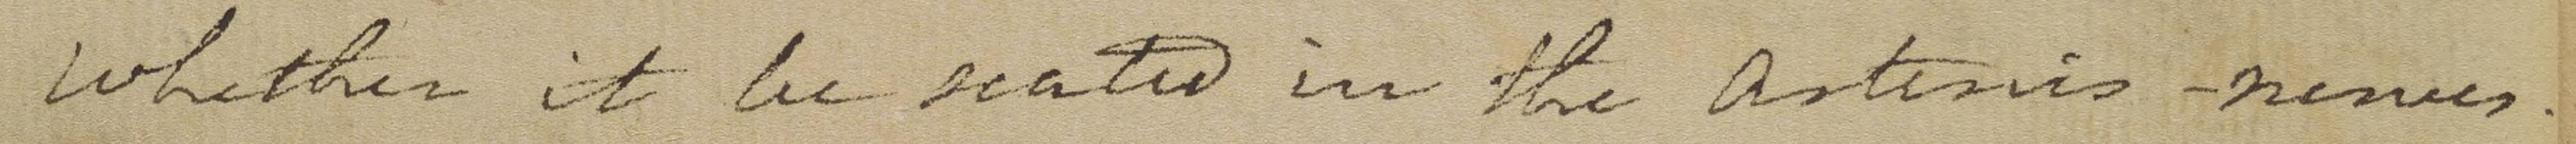whether it be seated in the arteries, nerves
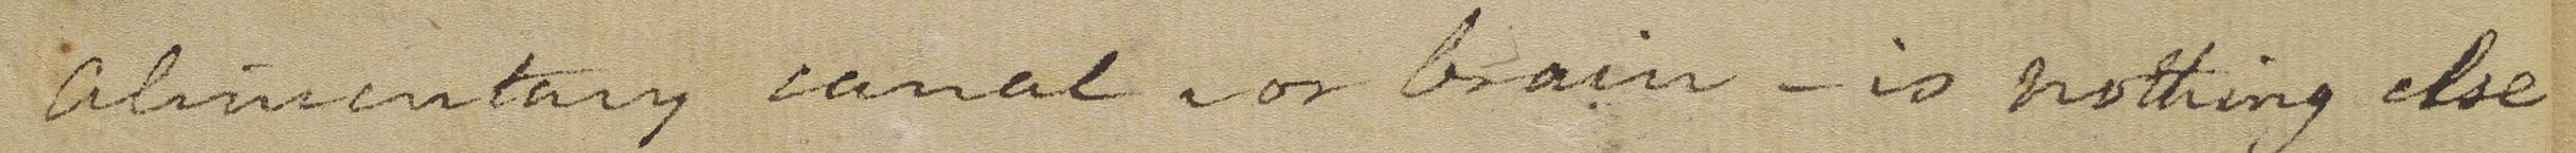alimentary canal, or brain - is nothing else
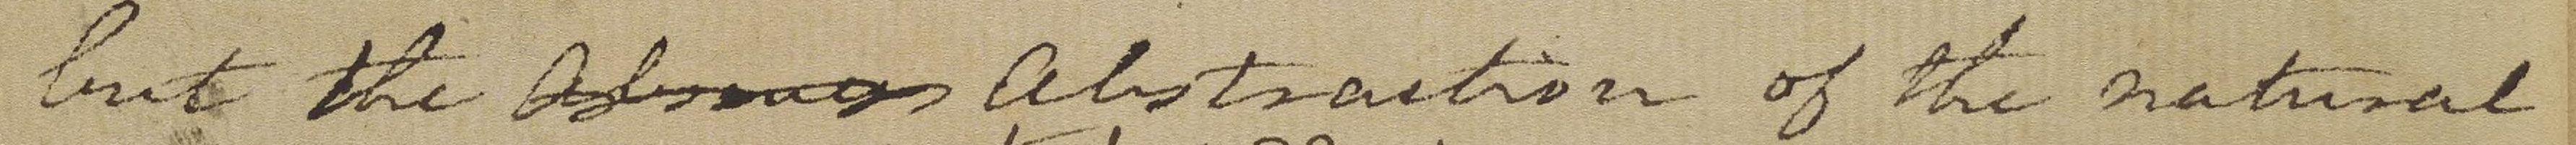but the [Ab____] Abstraction of the natural
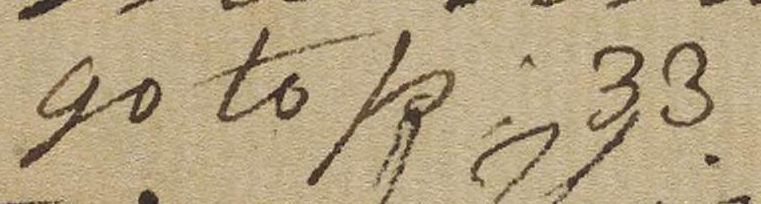go to p. 33+
